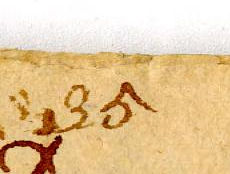35
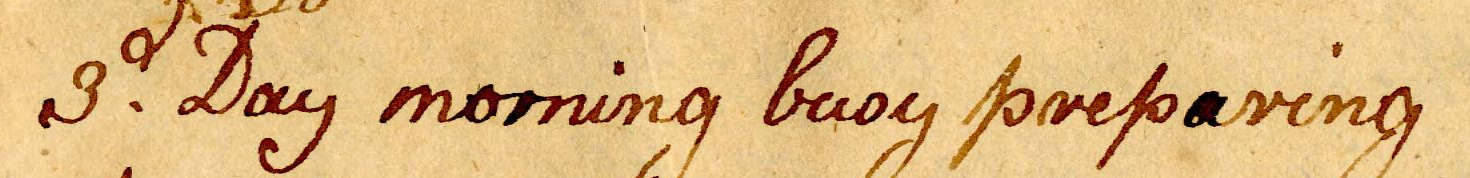3^d. Day morning busy preparing
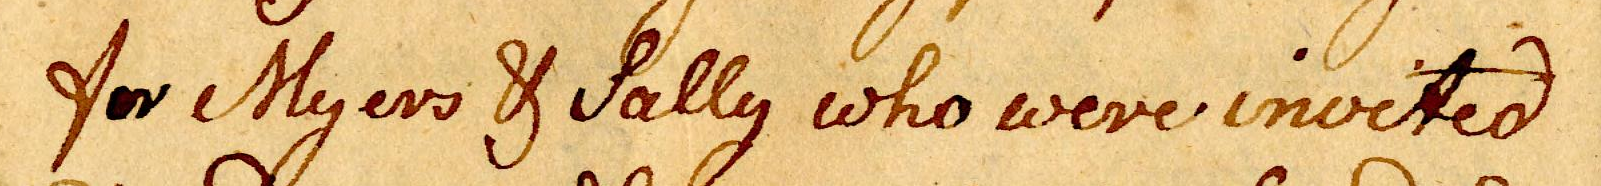for Myers & Sally who were invited
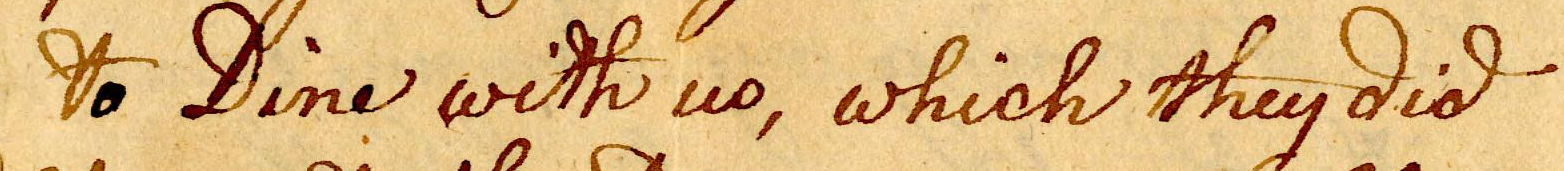to Dine with us, which they did
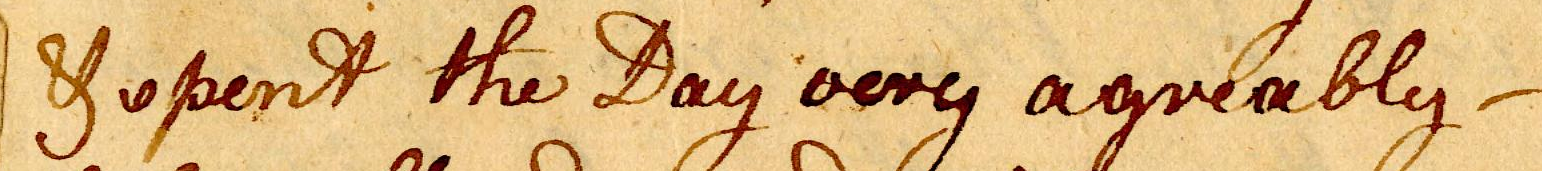& spent the Day very agreably-
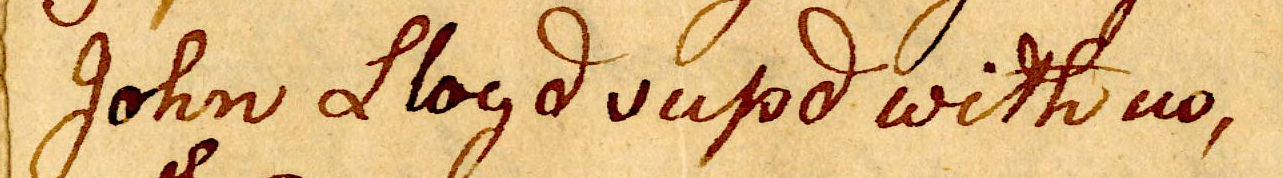John Lloyd supd with us,
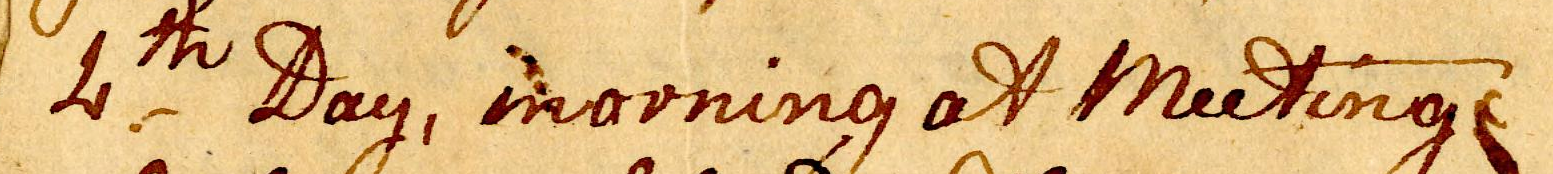4^th Day, morning at Meetings
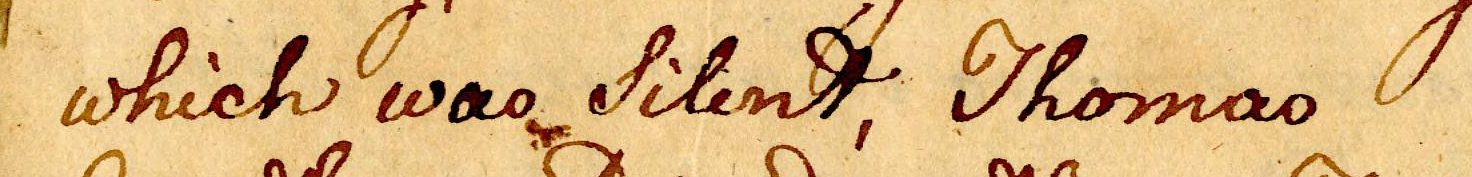which was Silent, Thomas
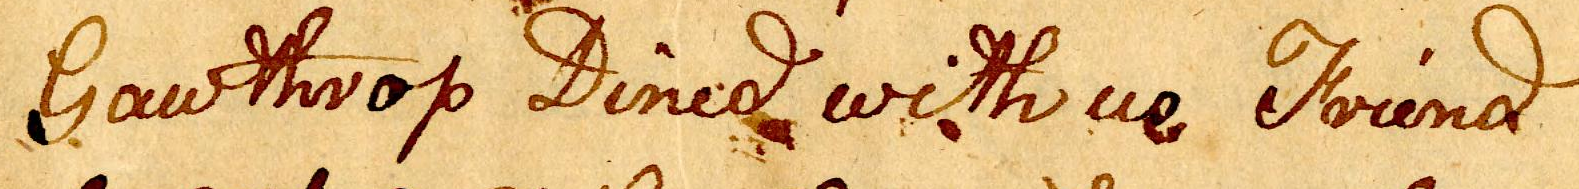Gawthrop Dined with us Friend
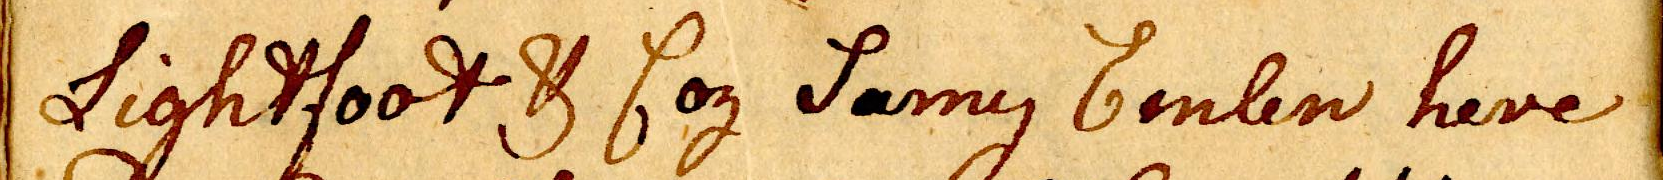Lightfoot & Coz Samy Emlen here
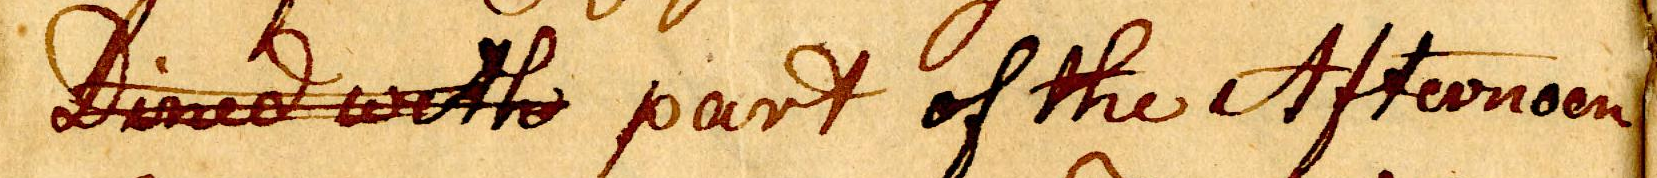[Dined with] part of the Afternoon
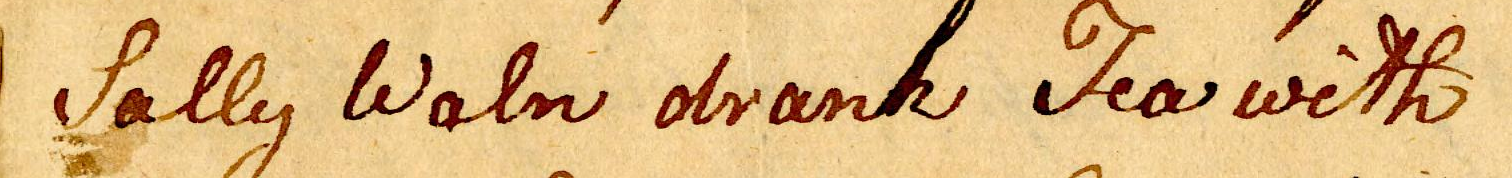Sally Waln drank Tea with
